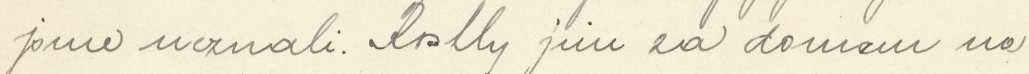jsme neznali. Rostly jim za domem na
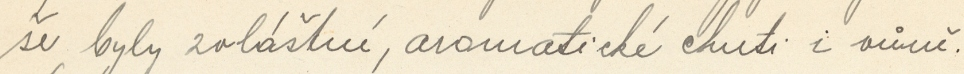še byly zvláštní, aromatické chuti i vůně.
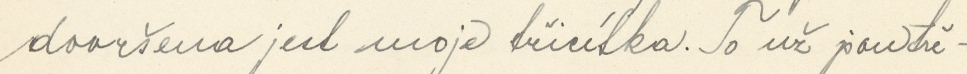dovršena jest moje třicítka. To už jsou tře-
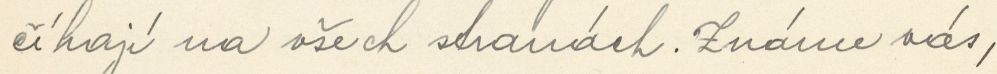číhají na všech stranách. Známe vás,
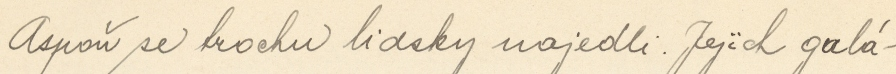Aspoň se trochu lidsky najedli. Jejich gulá-
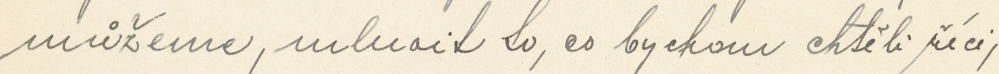můžeme, mluvit to, co bychom chtěli říci,
